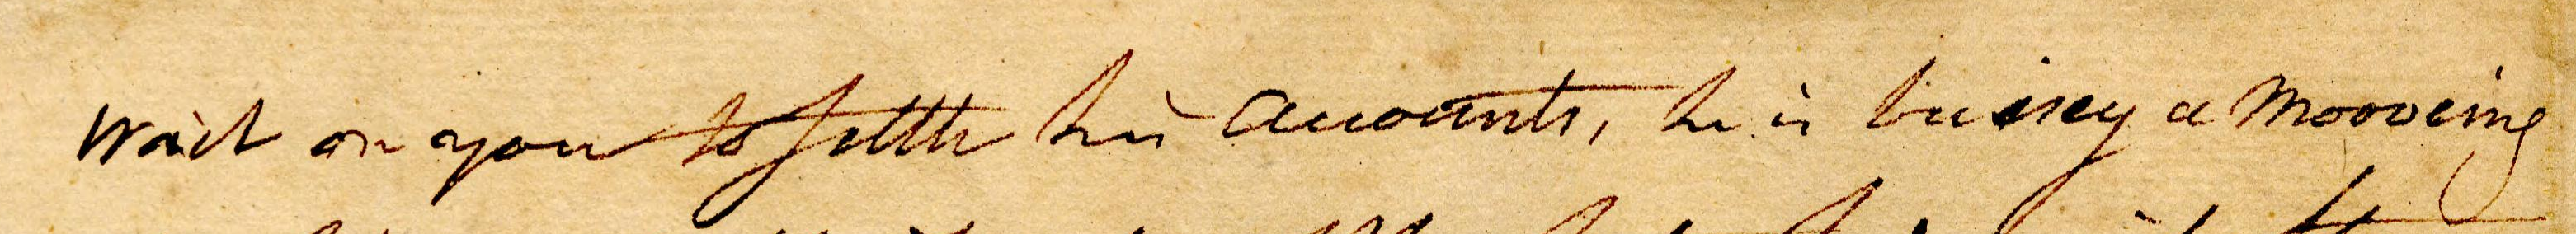wait on you to settle his Accounts, he is buisey a mooveing
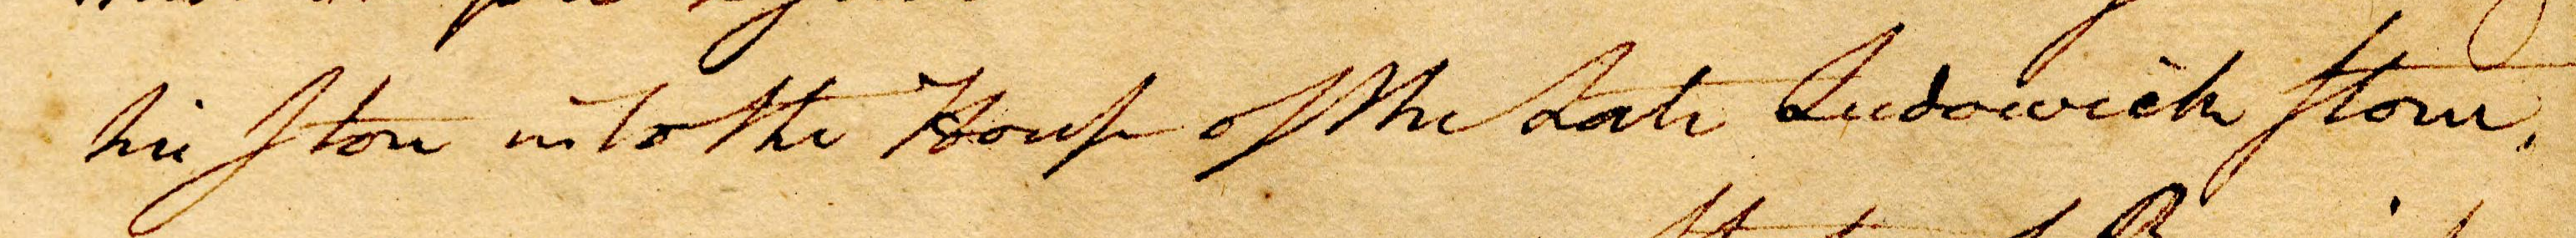his store into the House of the Late Ludowick Home
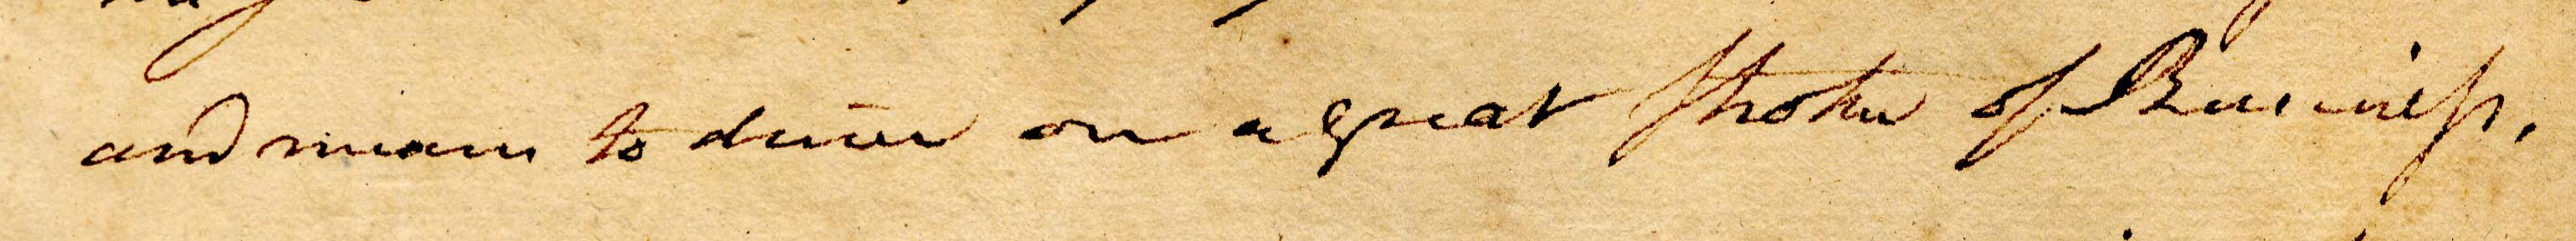and means to drive on a great shoke of buisiness
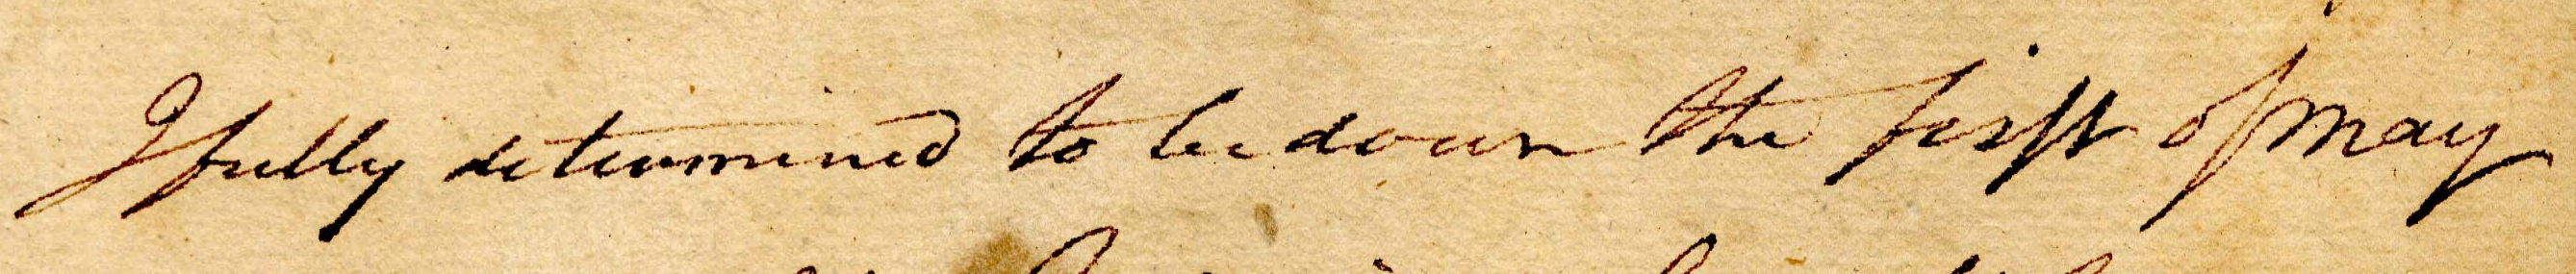I fully determined to be down the fifth of May
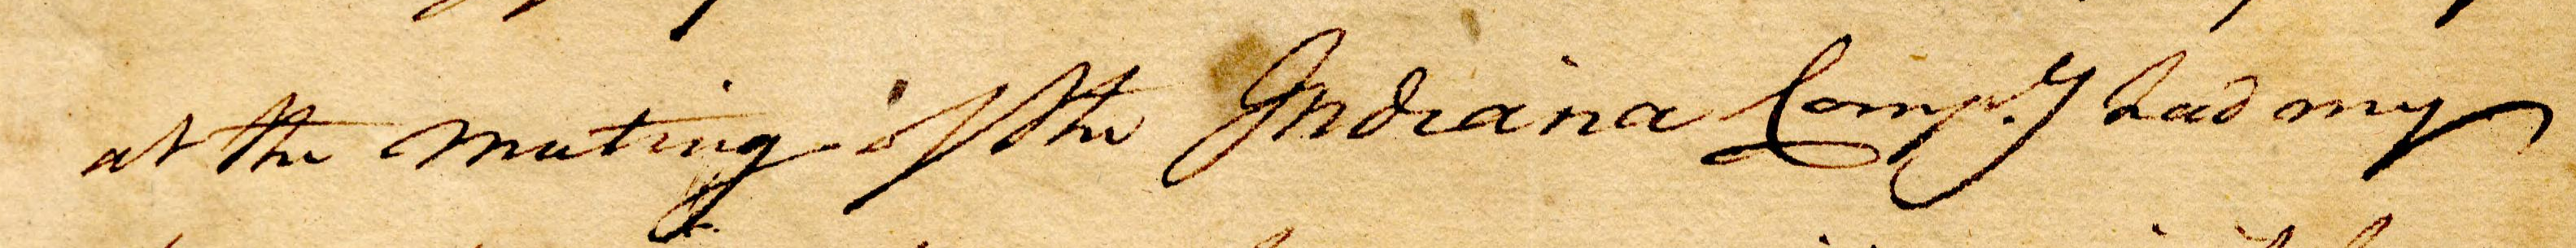at the meeting of the Indiana Comp^y. had my
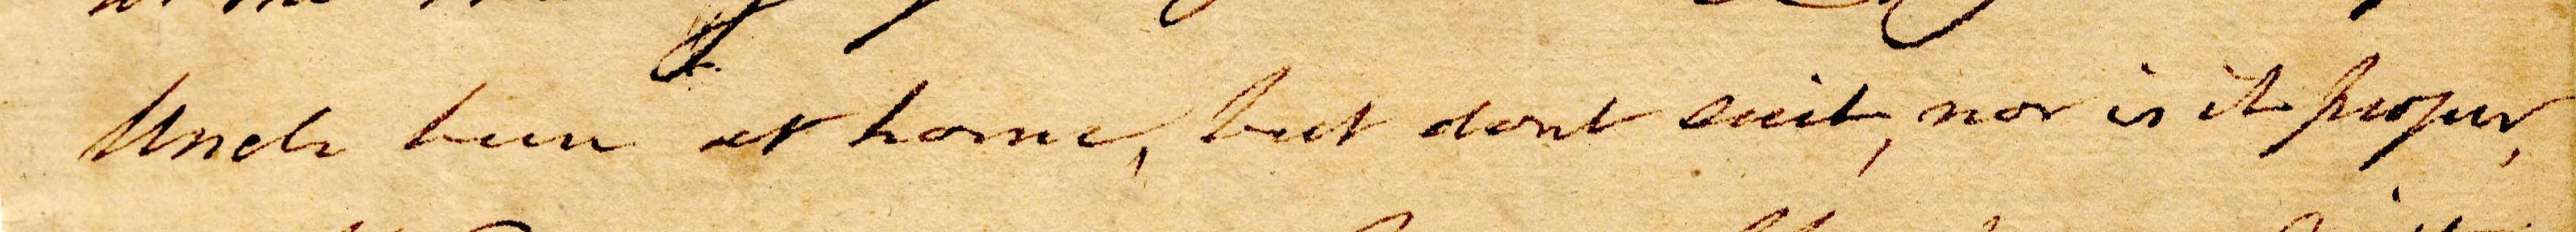Uncle been at home, but dont suit, nor is it proper
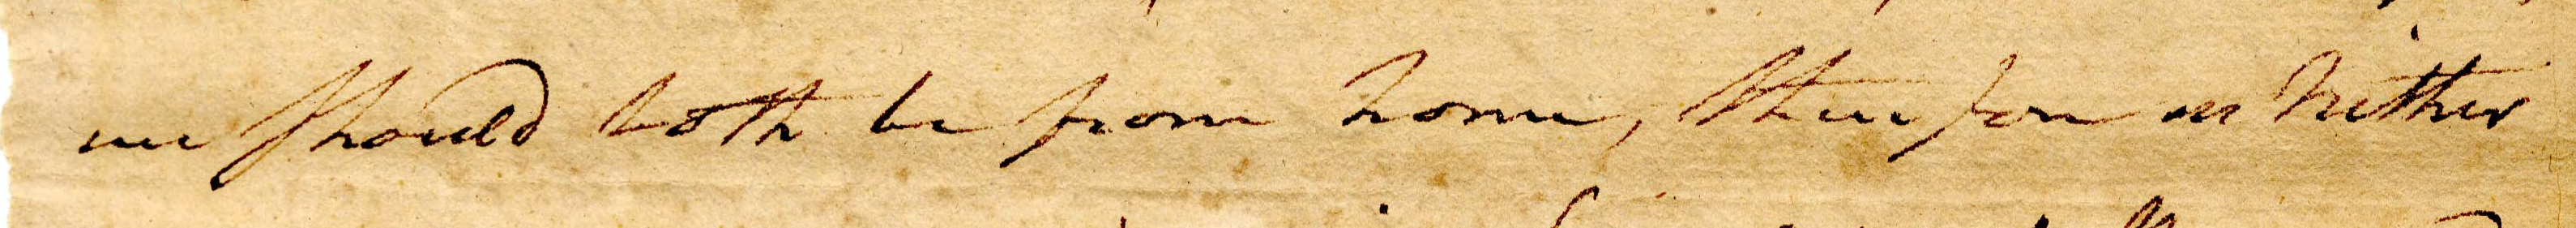we should both be from home, therefore as neither
